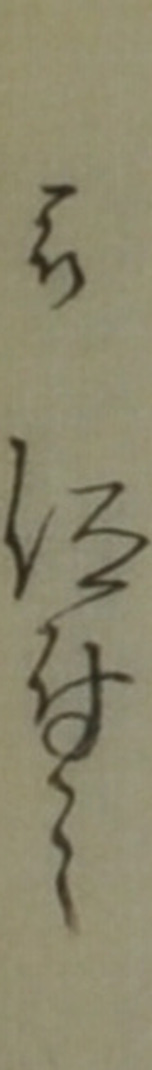被仰付之
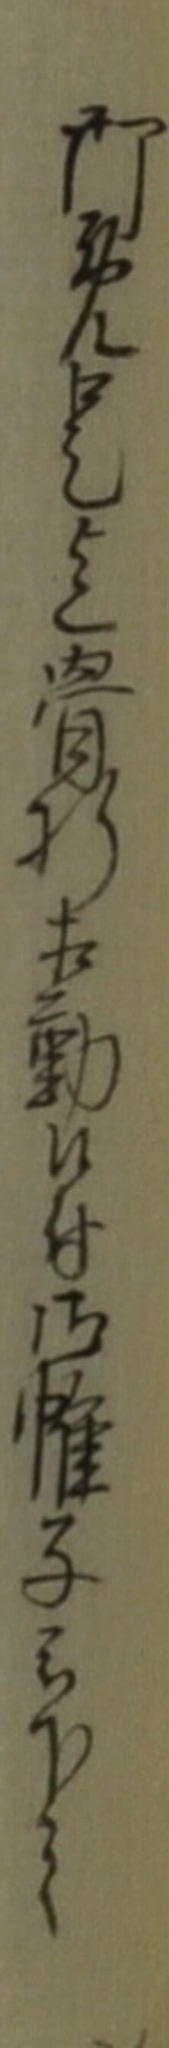御免是迄骨折相勤方候付御帷子被下之
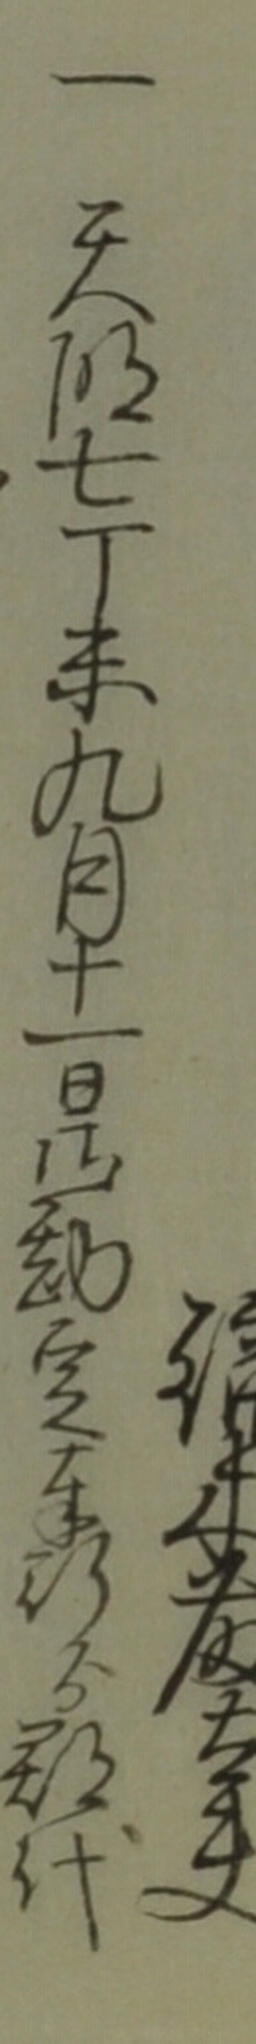一天明七丁未九月十一日御勘定奉行ゟ郡代
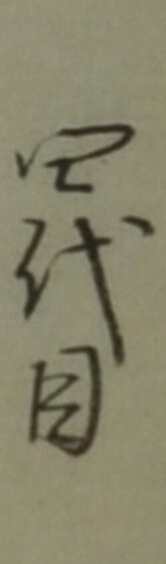四代目
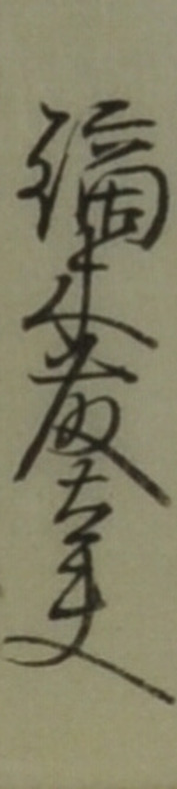鏑木藤太夫
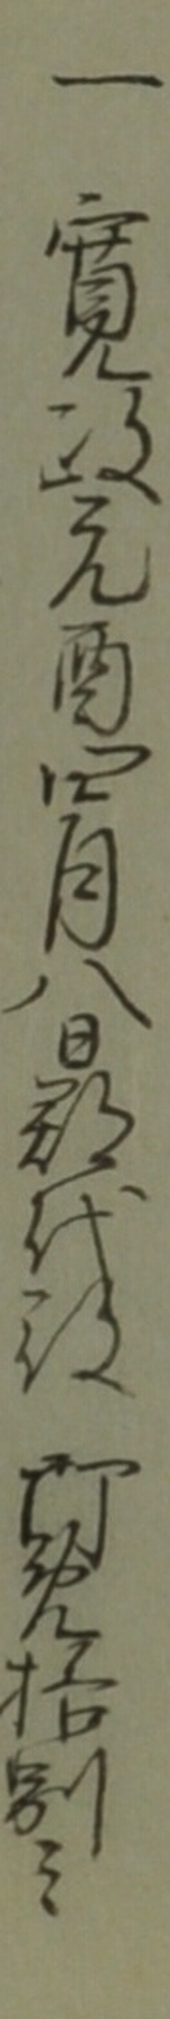一寛政元酉四月八日郡代役御免格別之
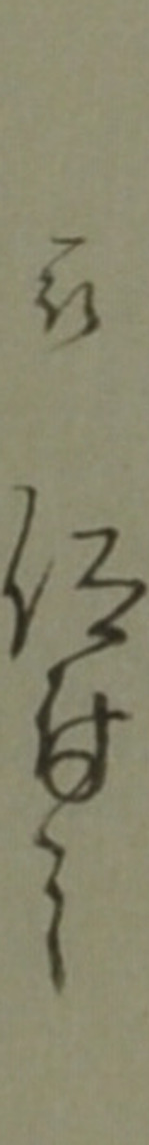被仰付之
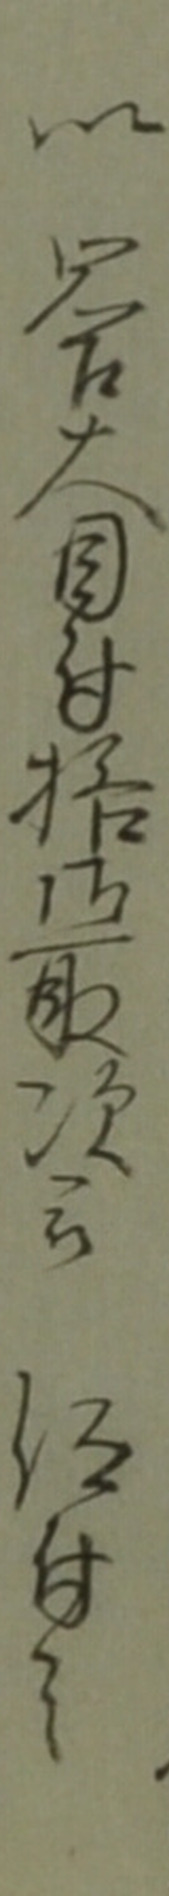以思召大目付格御取次被仰付之
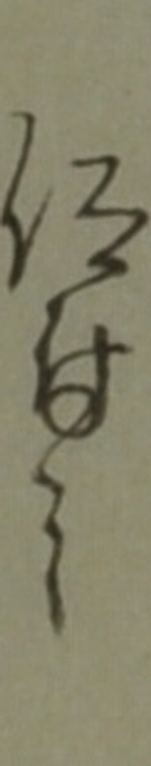仰付之
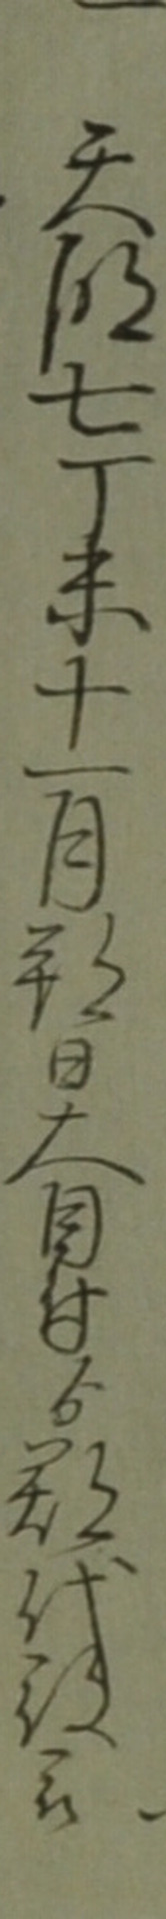一天明七丁未十一月朔日大目付ゟ郡代役被
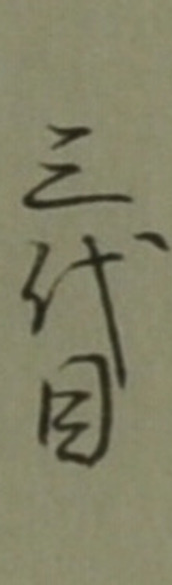三代目
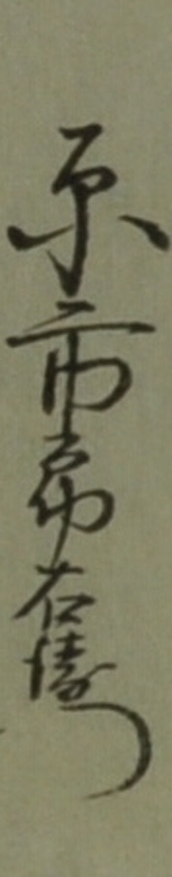原市郎右衛門
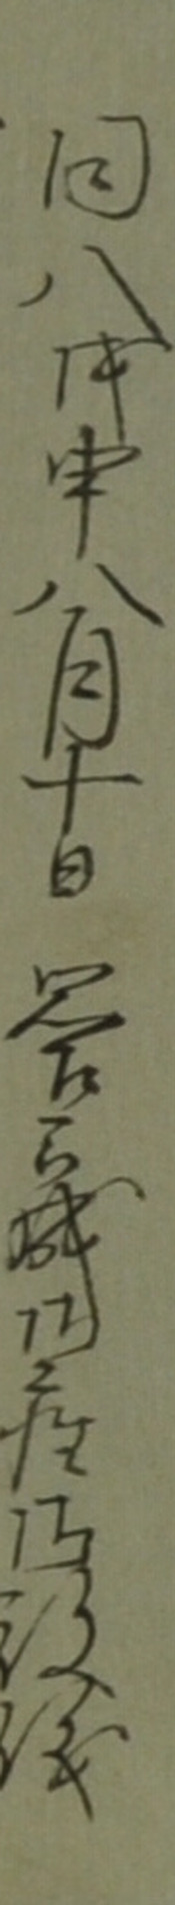一同八戊申八月十日思召被成御座御役儀
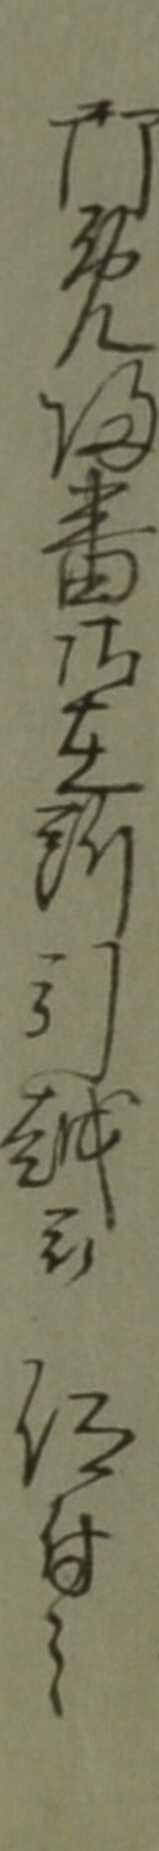御免帰番御在所引越日仰付之
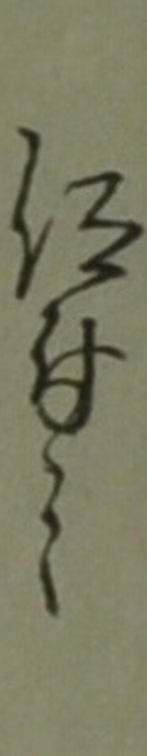仰付之
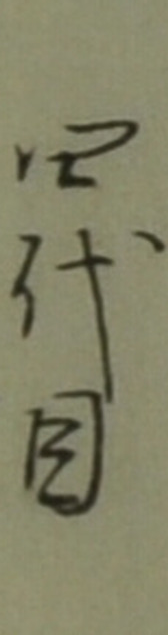四代目
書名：諸御役代々録（二）
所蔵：伊那市立高遠町図書館・合同会社AMANE
